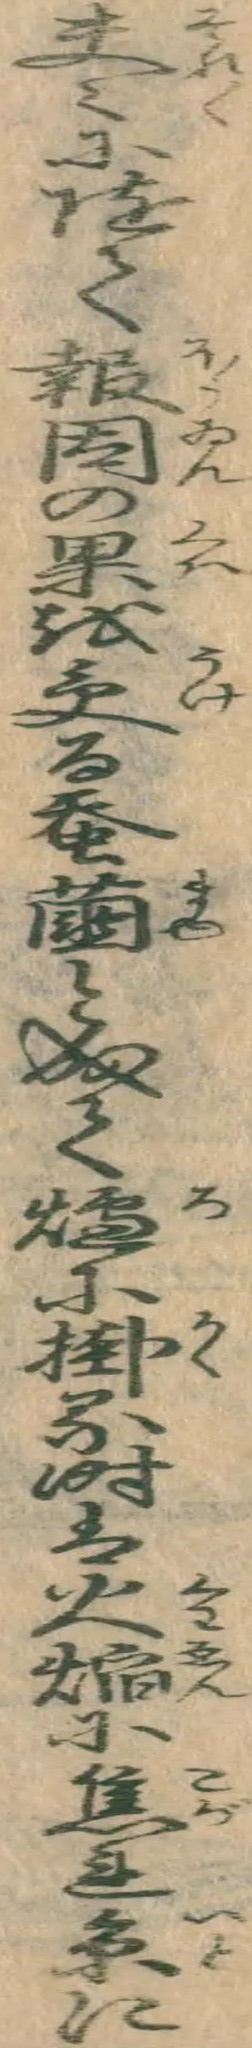夫々に随て報因の果を受る蚕繭と成て爐に掛る時は火焔に焦れ糸に
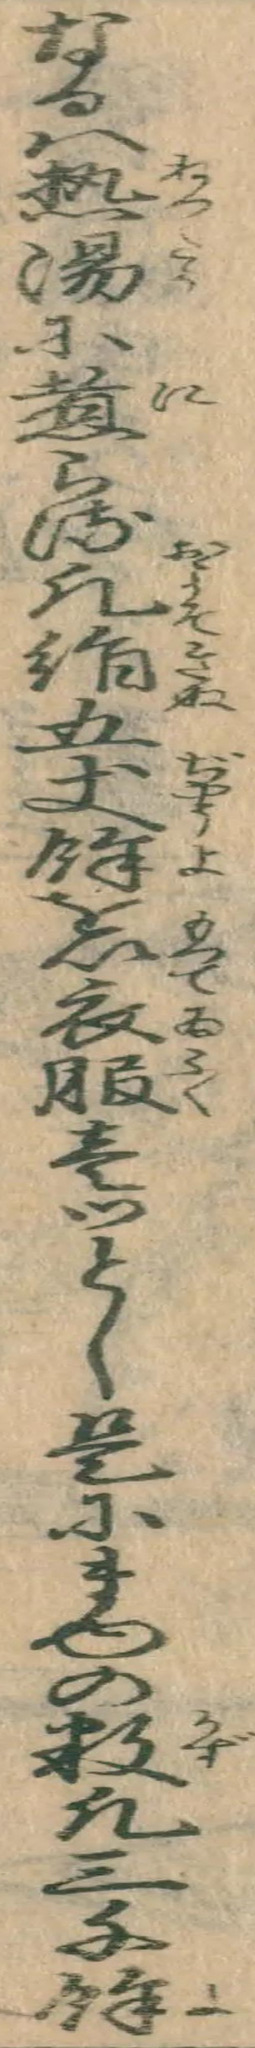なるは熱湯に煮らる凡絹五丈余を以衣服壱ツとし是にまゆの数凡三千余
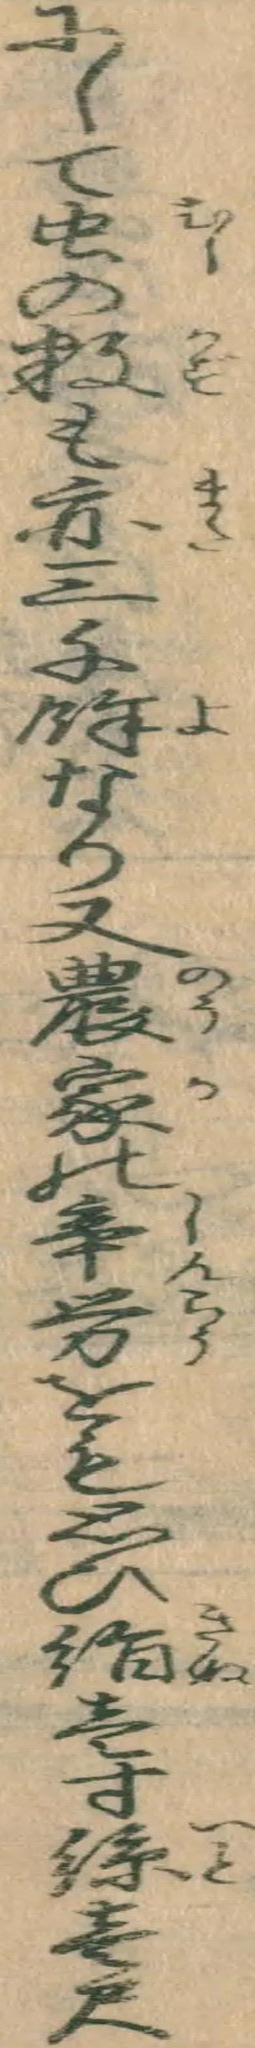にして虫の数も亦三千余なり又農家の辛労をも思ひ絹壱寸糸（
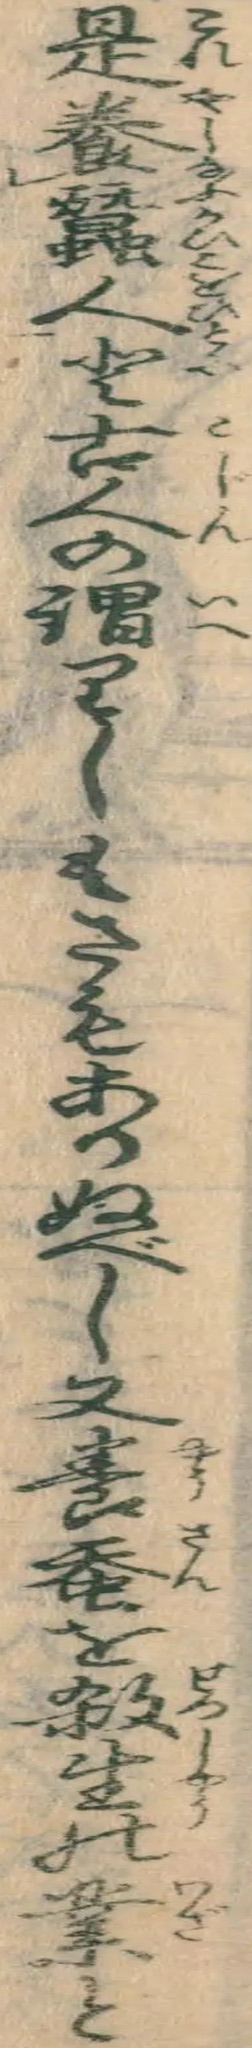是養蚕人と古人の謂りしもさもありぬべし又養蚕を殺生の業と
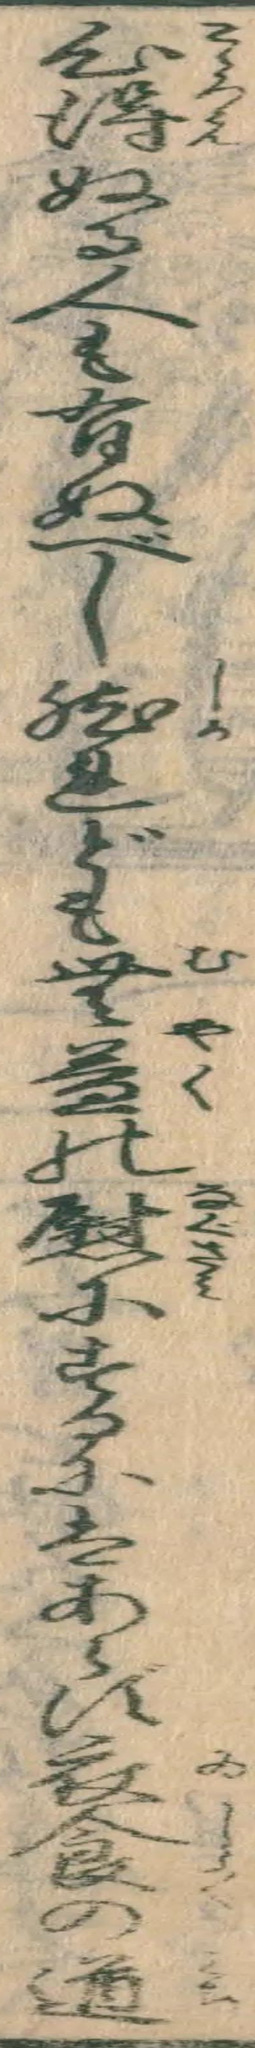心得ぬる人も有ぬべし然れども無益の慰にするにはあらず衣食の道
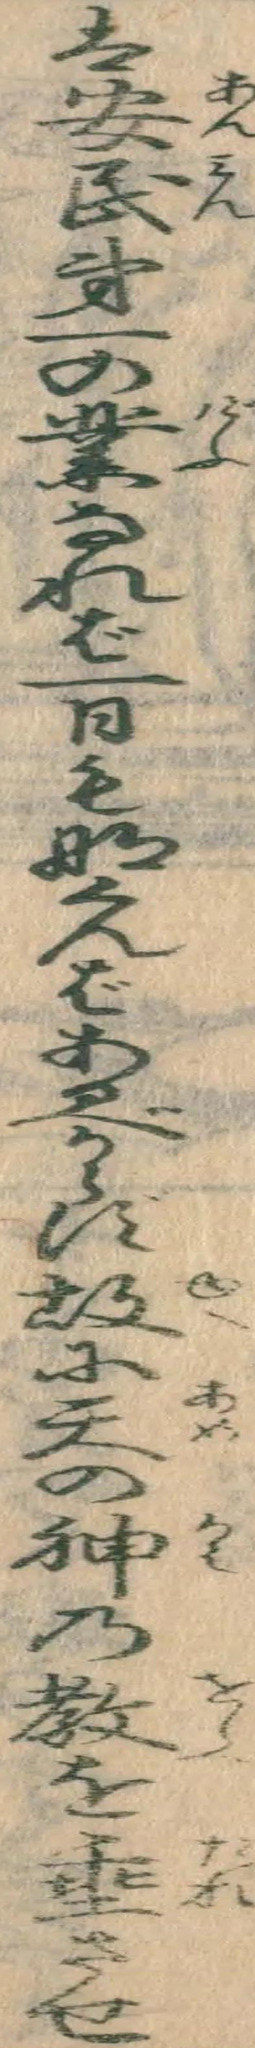は安民第一の業なれば一日もなくんばあるべからず故に天の神の教を垂させ
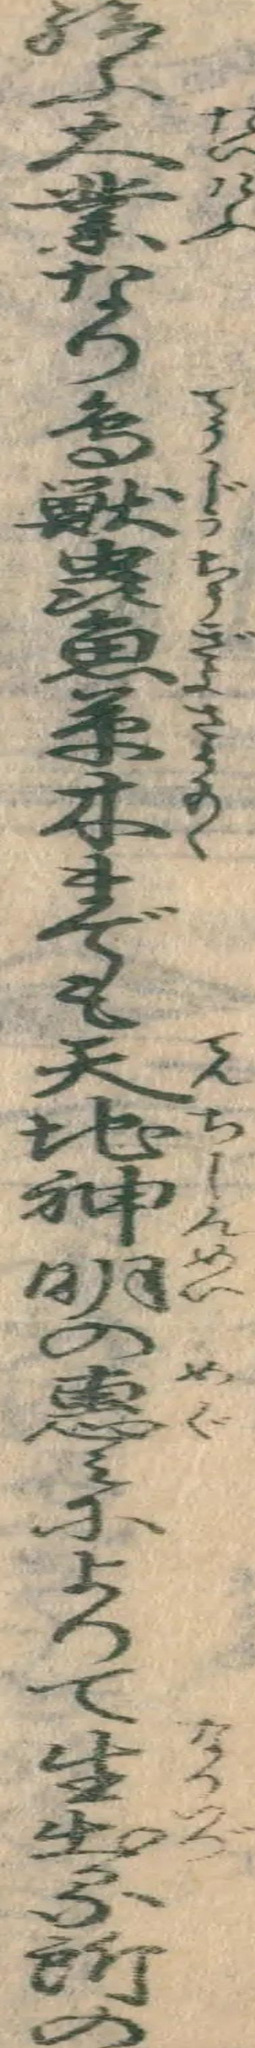給ふ大業なり鳥獣虫魚草木までも天地神明の恵みによりて生出る所の
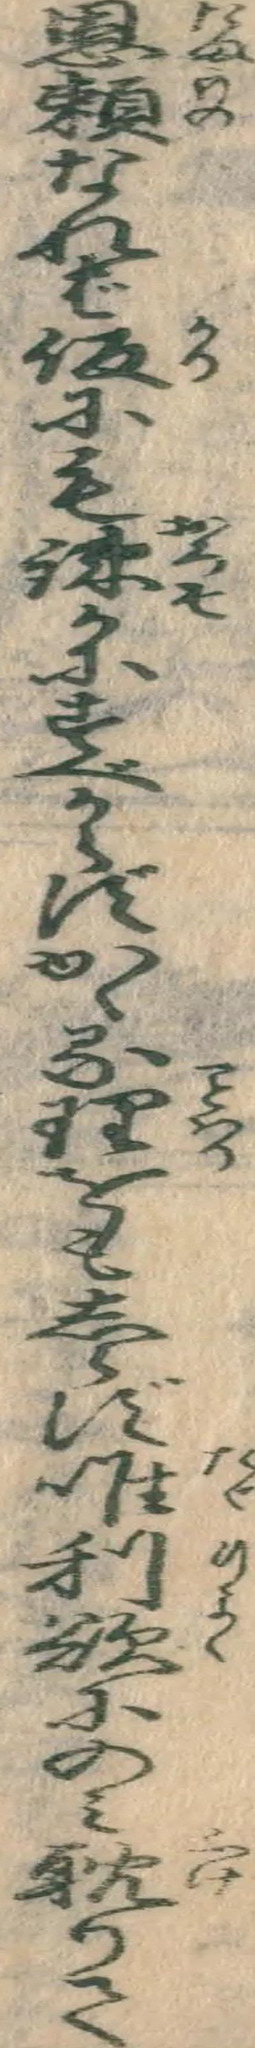恩頼なれば仮にも疎かにすべからずかゝる理をもしらず唯利欲にのみ耽りて
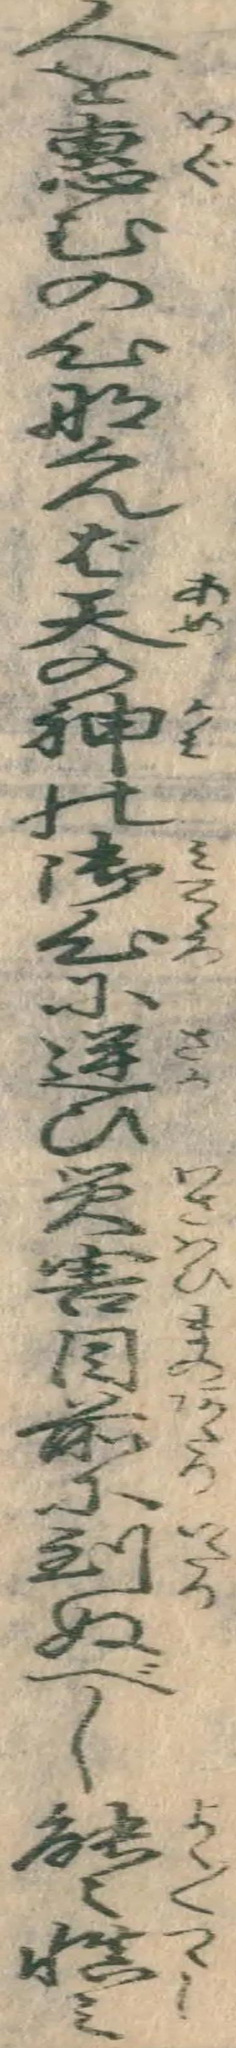人を恵むの心なくんば天の神の御心に逆ひ災害目前に到ぬべし能々慎み
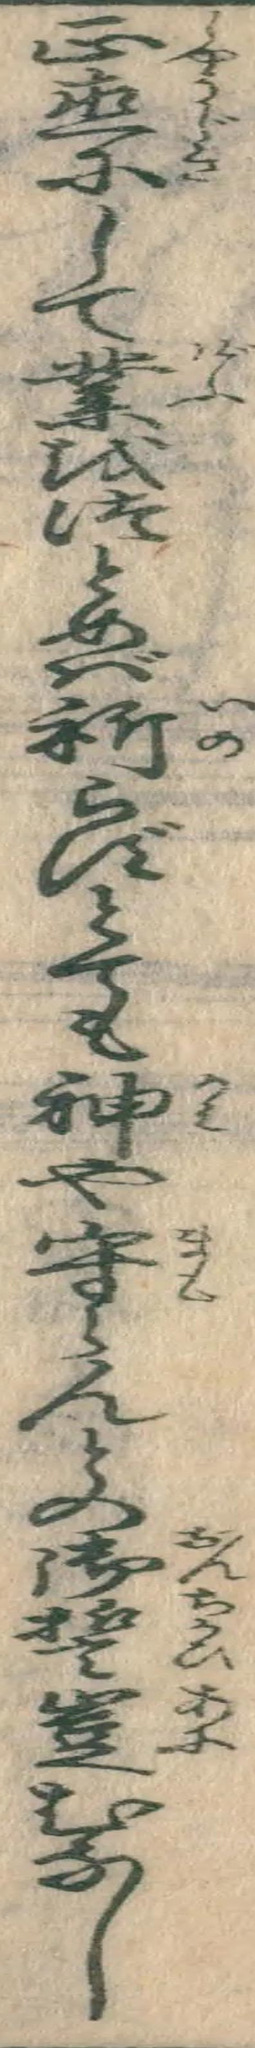正直にして業をつとめば祈らずとても神や守らんとの御誓豈むなし
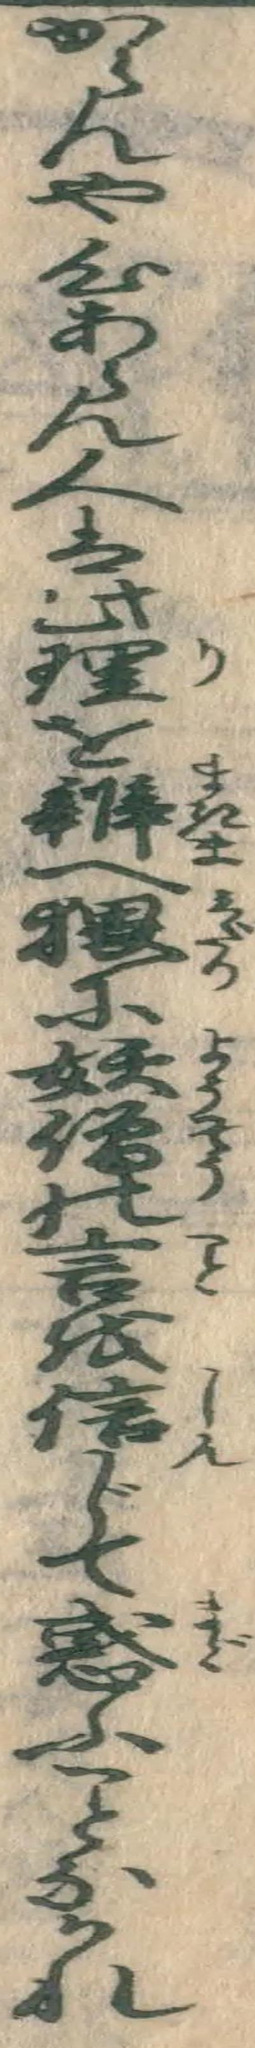からんや心あらん入は此理を弁へ猥に妖僧の言を信じて惑ふことなかれ
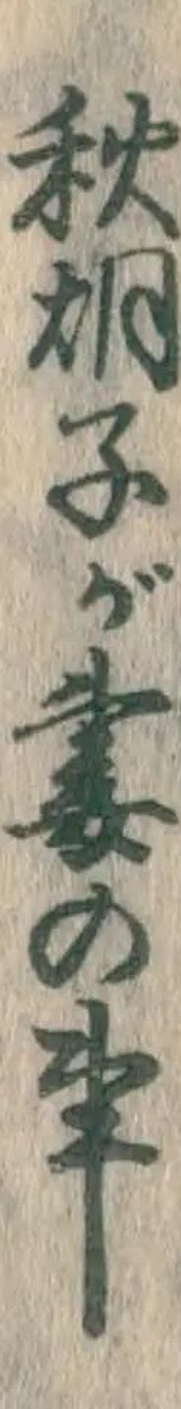秋胡于が妻の事
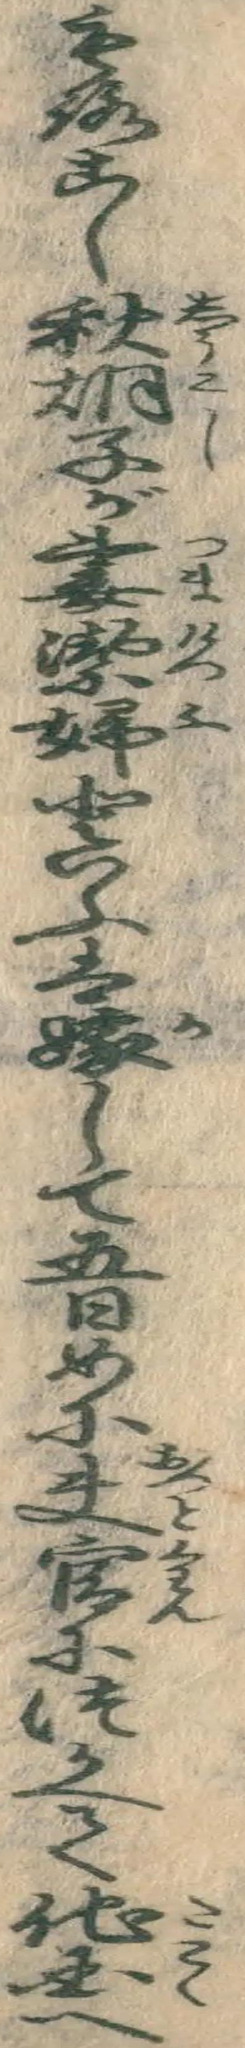もろこし秋胡子が妻潔婦といふは嫁して五日めに夫官につかへて他国へ
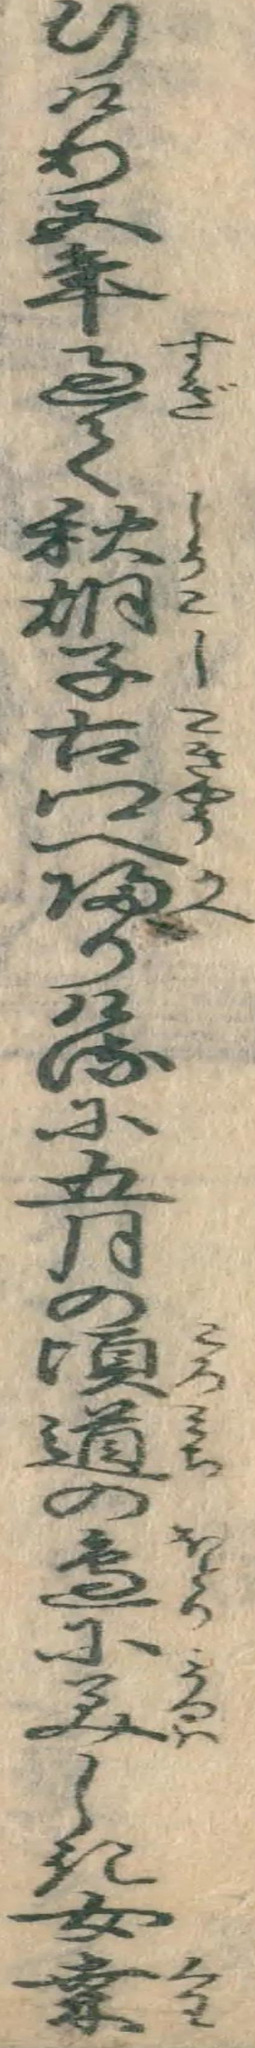行けり五年過て秋胡子古郷へ帰りけるに五月の頃道の辺に美しき女桑

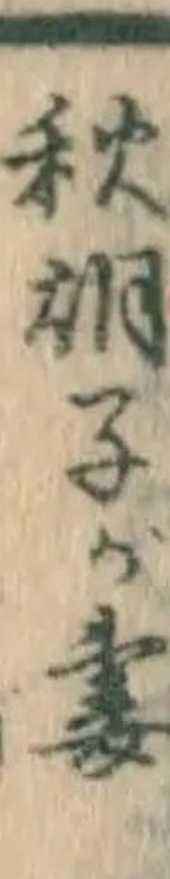秋胡子が妻
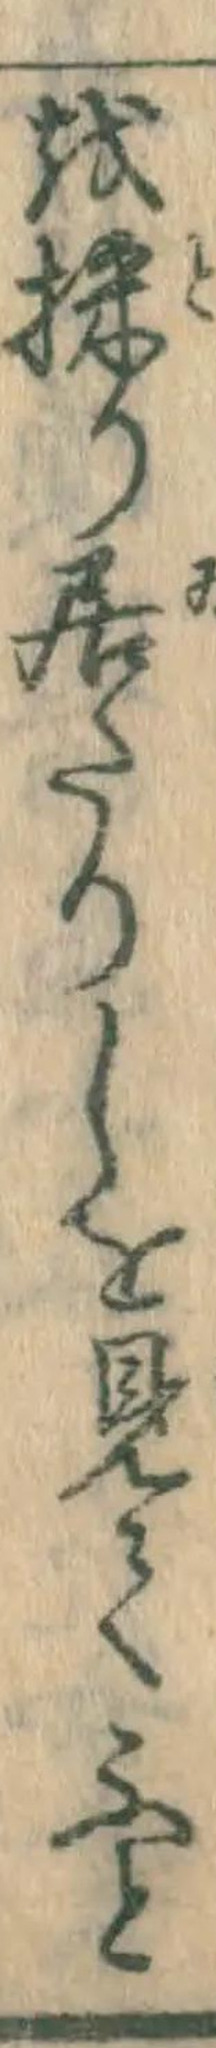を採り居たりしを見てふと
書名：養蚕秘録 3巻. [3]
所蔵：国立国会図書館 National Diet Library, JAPAN
